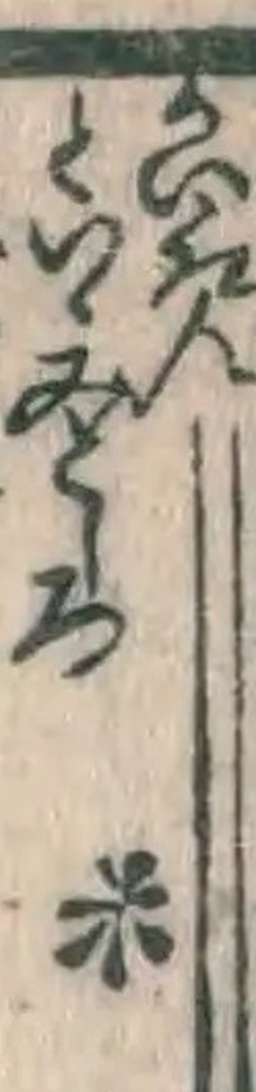といゝみとしろ
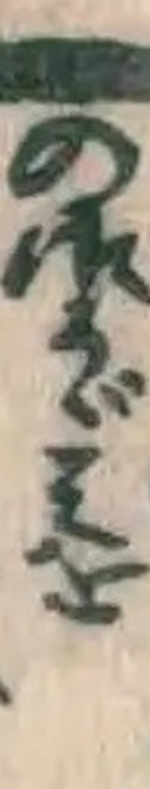の御かゞみを
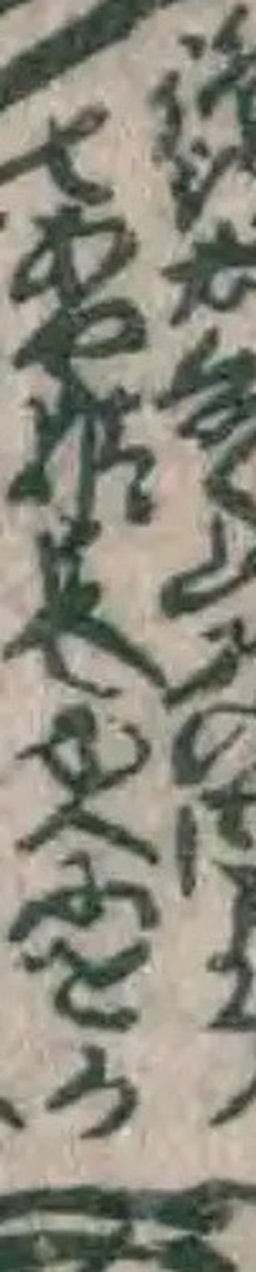七あや姫ゆへにをか
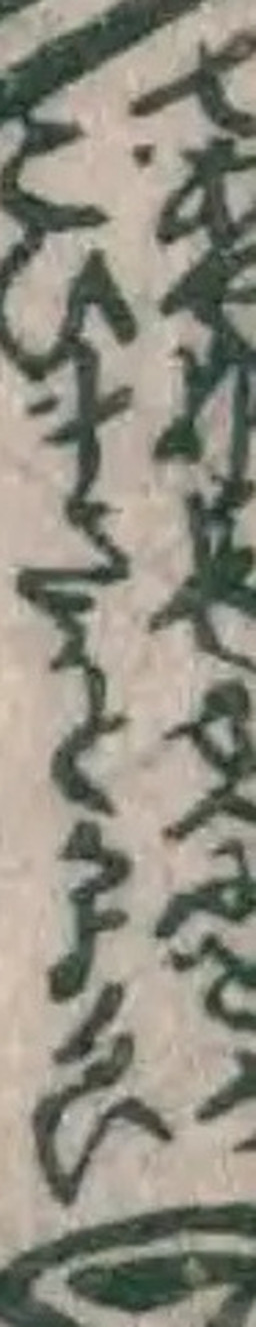こひまさかとかよるい
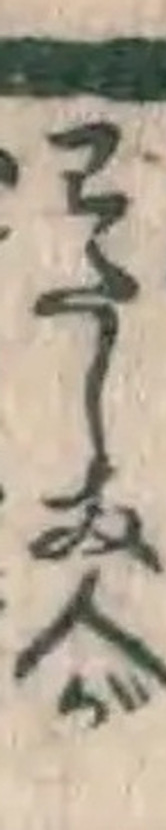わたし両人が
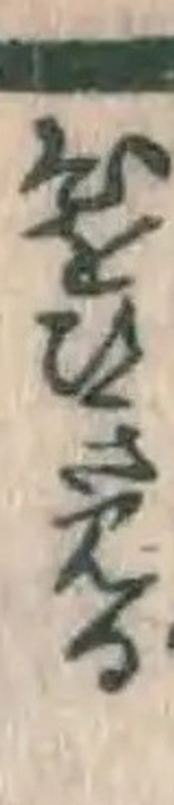心をひき見る
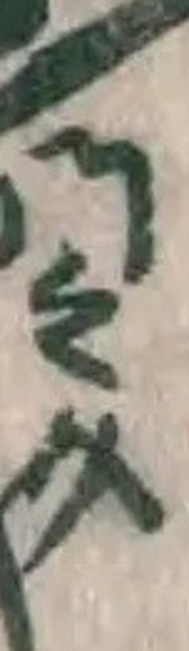門之介
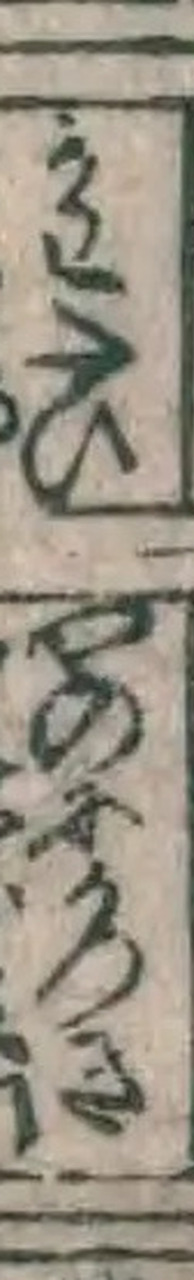かわたひやの荷かつき
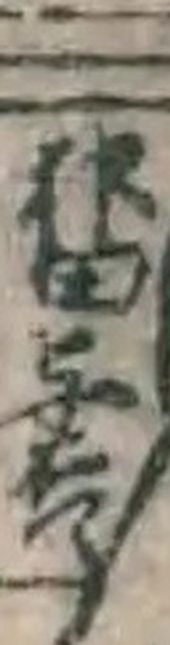神田与吉
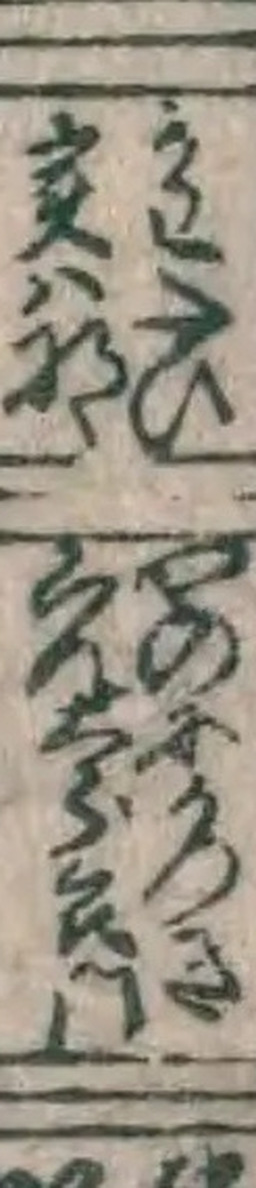実は将くん太郎良門
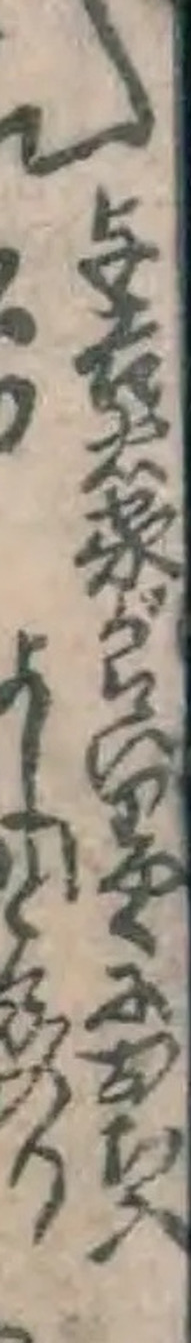与吉忠家がけいりやくにおち入
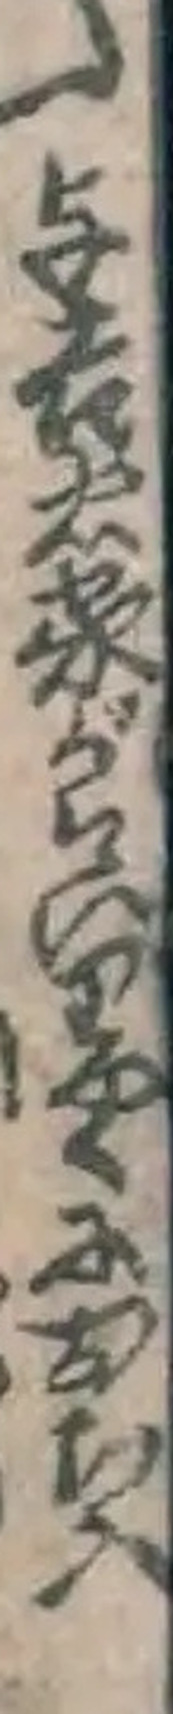与吉忠家がけいりやくにおち入
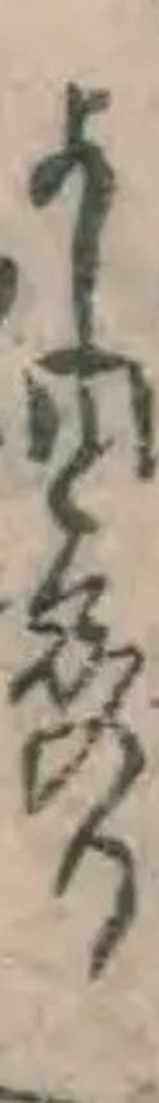よし門と名のり
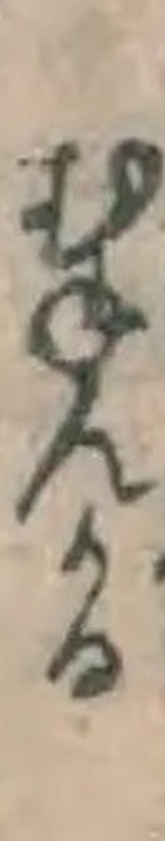むねんかる
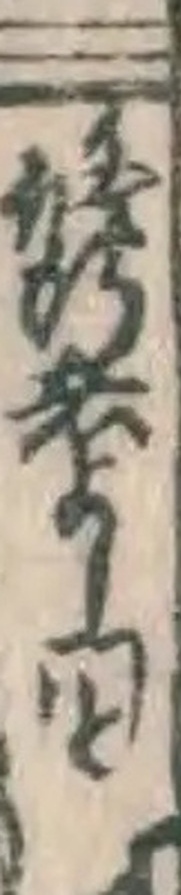修行者よし門と
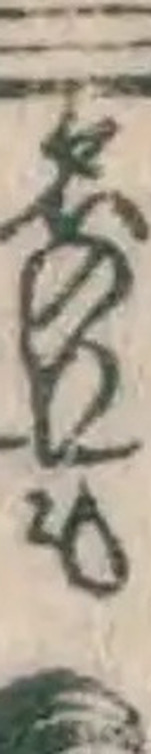名のりしも
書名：四天王宿直着綿
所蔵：国立国会図書館 National Diet Library, JAPAN
